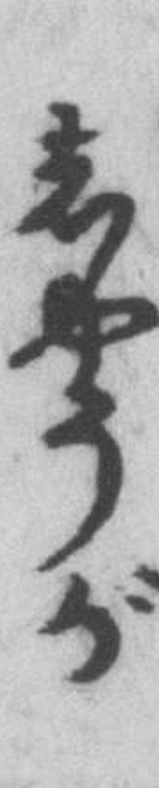しやうが
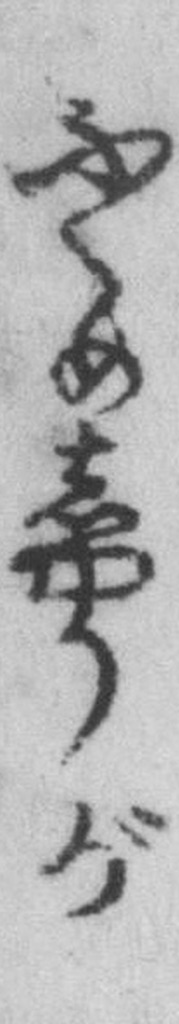ふくめしやうが

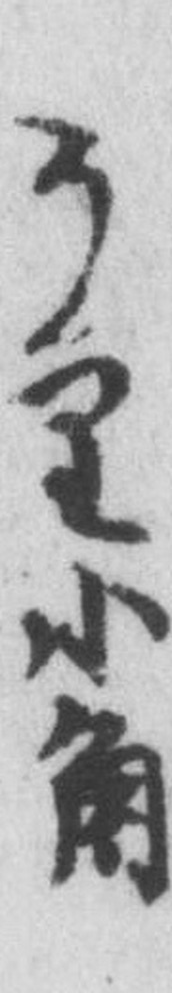くり小角
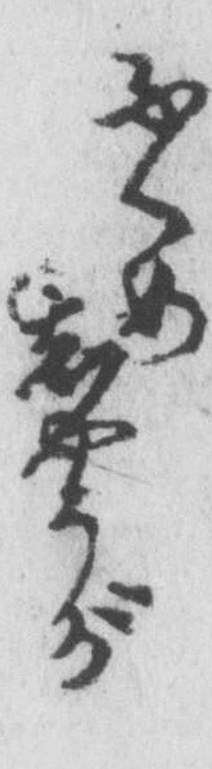しやうが
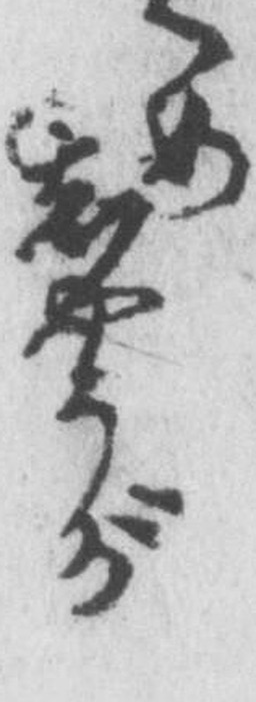しやうが
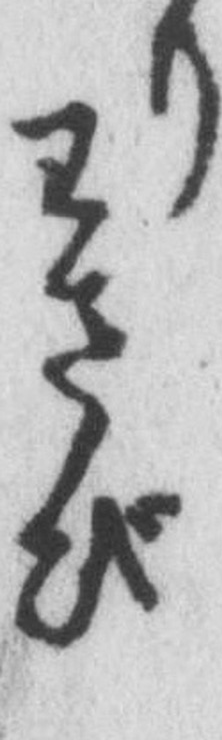わさび
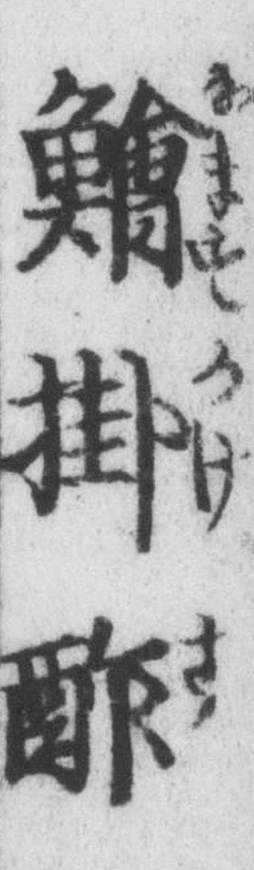鱠掛酢
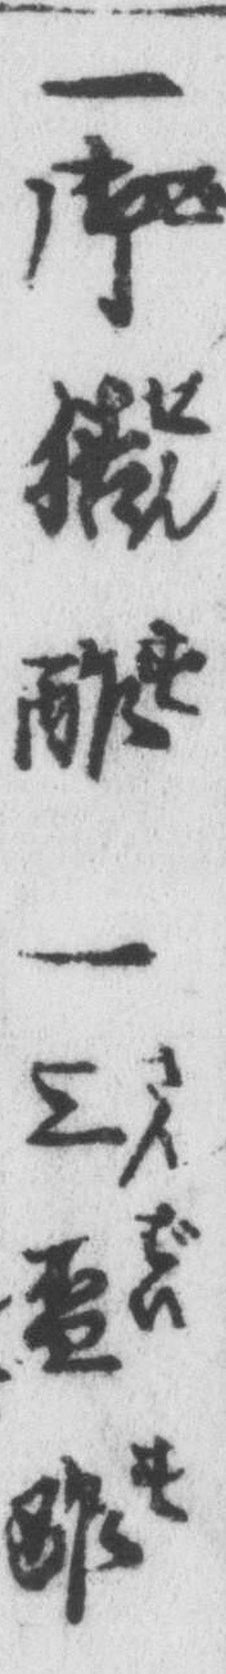一御膳酢一三盃酢
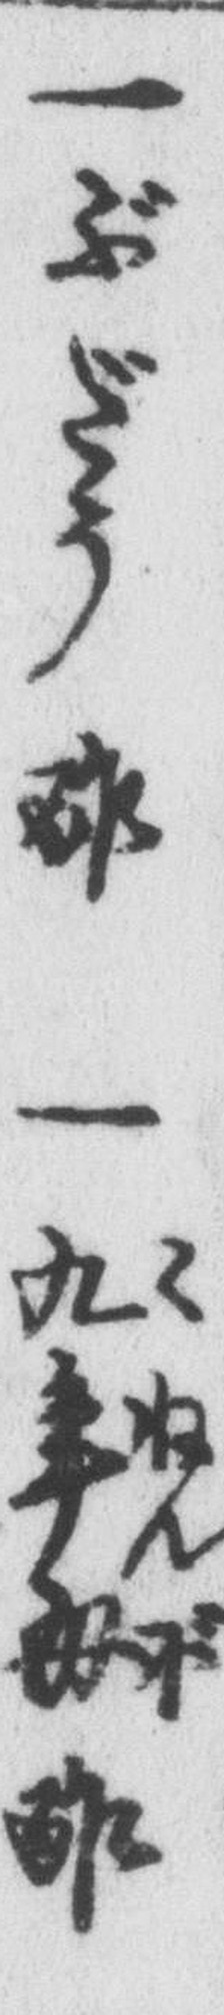一ぶどう酢一九年母酢
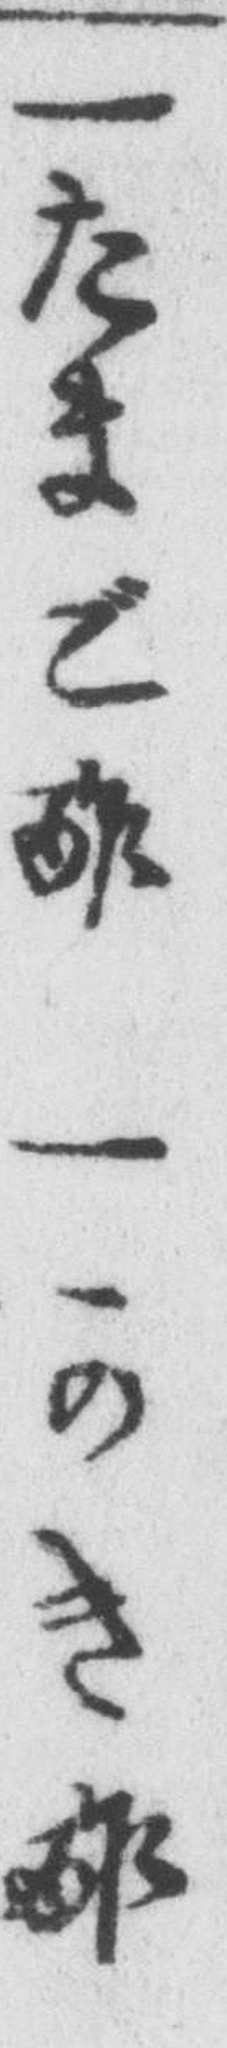一たまご酢一き酢
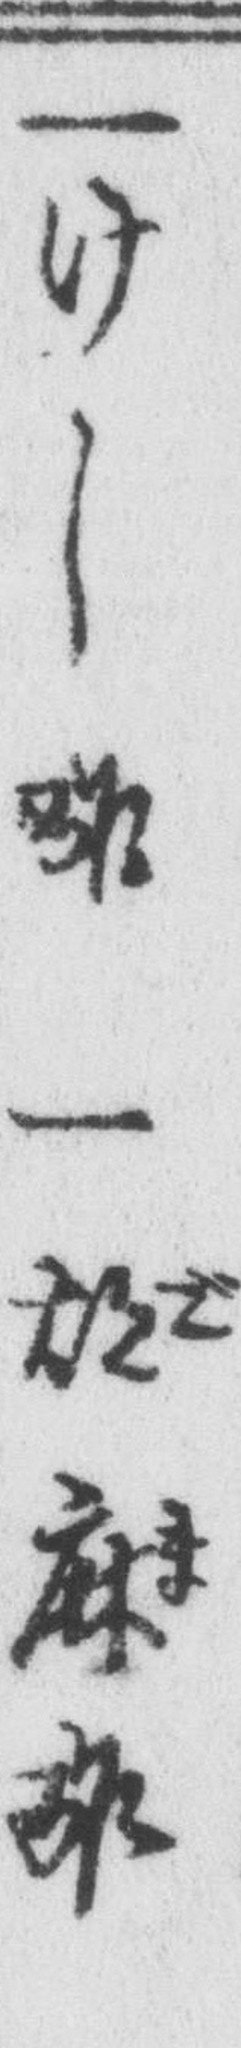一けし酢一胡麻酢
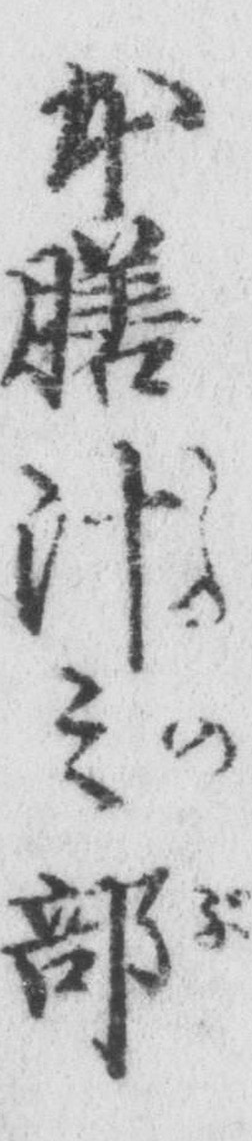本膳汁之部
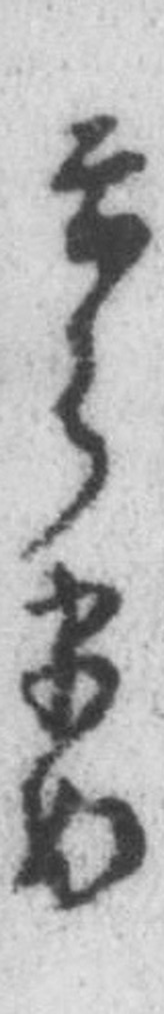そらまめ

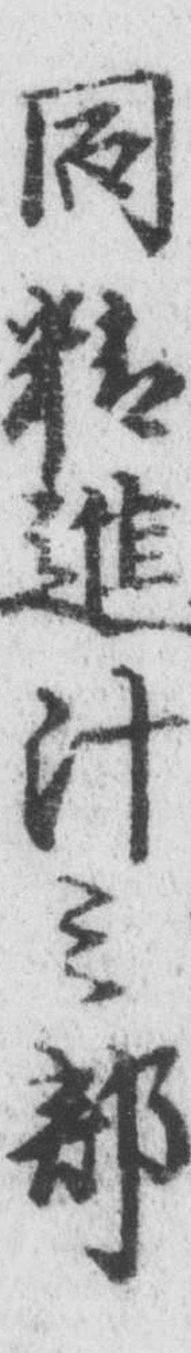同精進汁之部
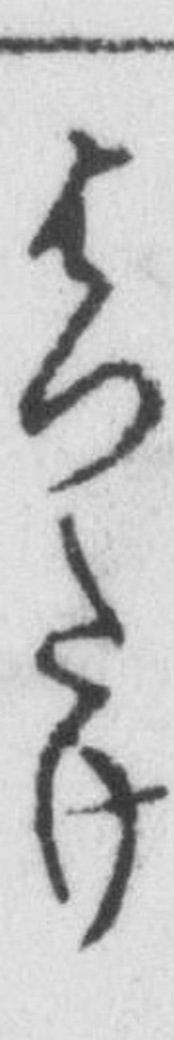はつたけ
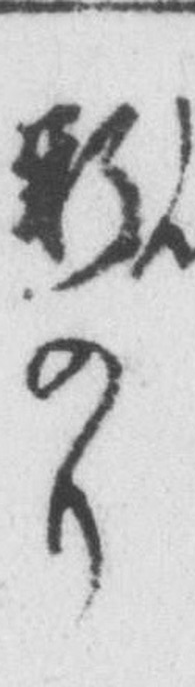新のり
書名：当世料理献立
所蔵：大阪府立大学学術情報センター 国文学研究資料館
